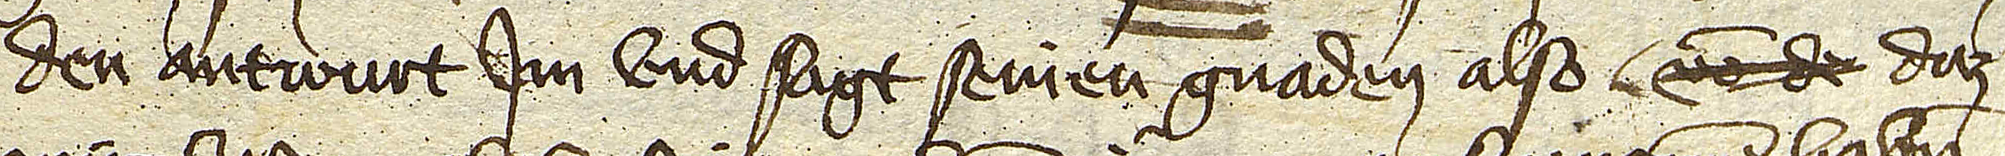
den antwurt Im vnd ſagt ſeinen gnaden alſo / vo* de daʒ
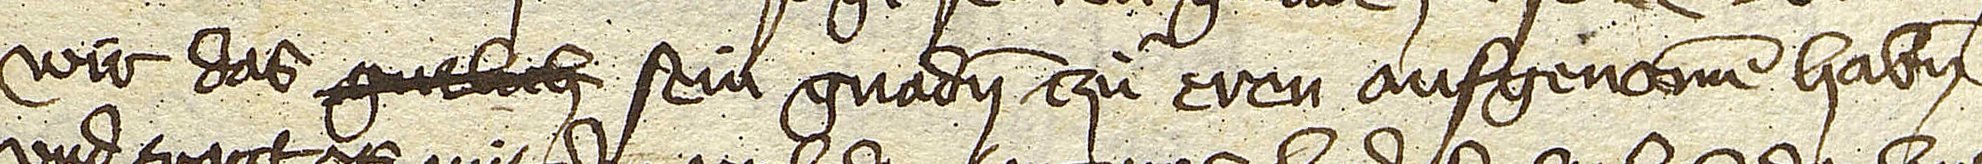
wir das gutlich ſein gnadn* cʒü eren aufgenome* habn*
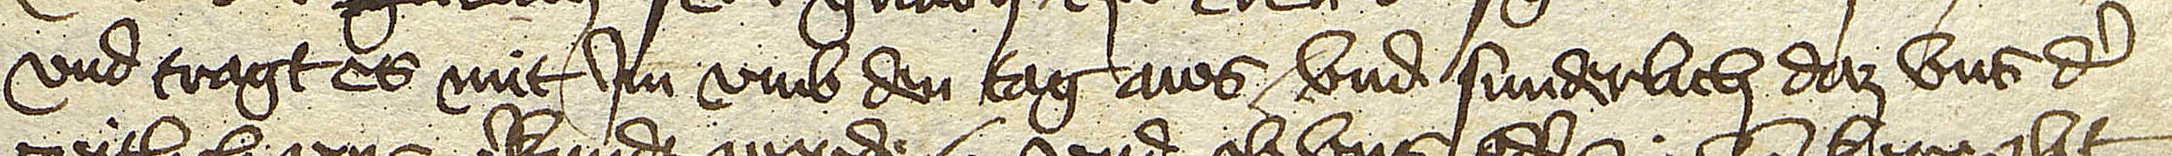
vnd tragt es mit Im vmb den tag aws / vnd ſunderlich daʒ vns d*
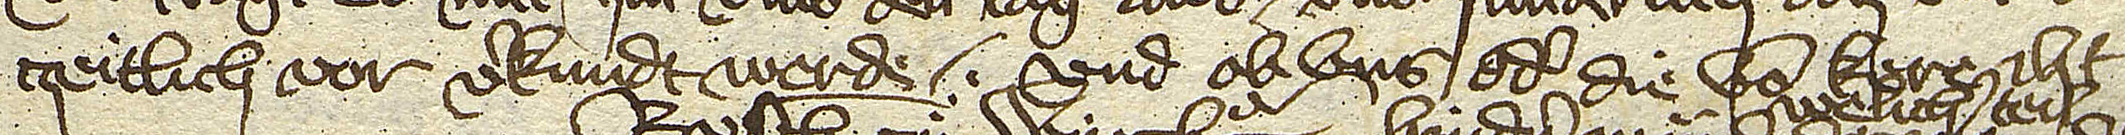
cʒeitlich vor v*kunde werde / . vnd ob vns die vo* kere iht
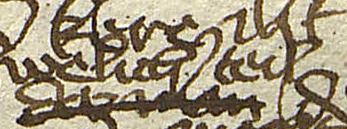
welich teil
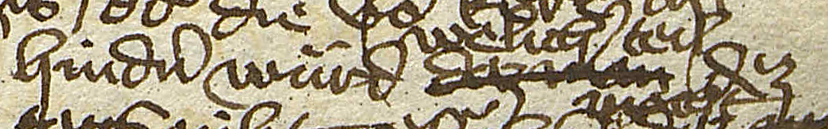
hindn* würd daʒ man deʒ
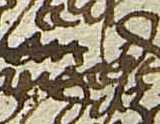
macht
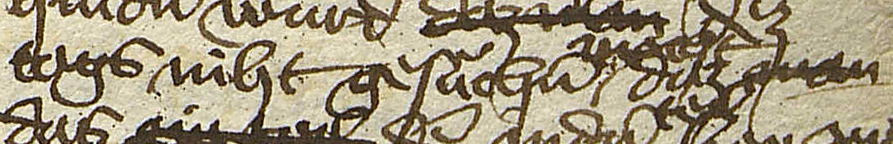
tags niht geſüchn* / daʒ man
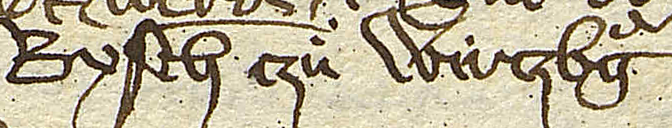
Byſch* cʒü Wircʒb*g
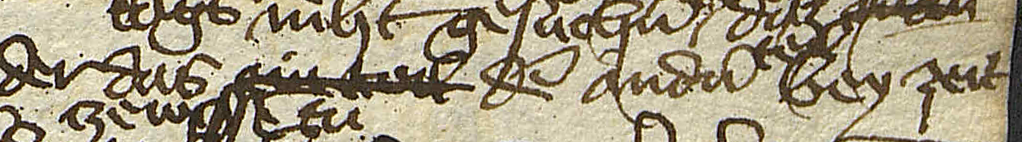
der das ein teil d* andn* bey cʒeit
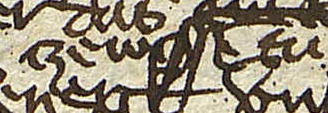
cʒewiſſe* tu
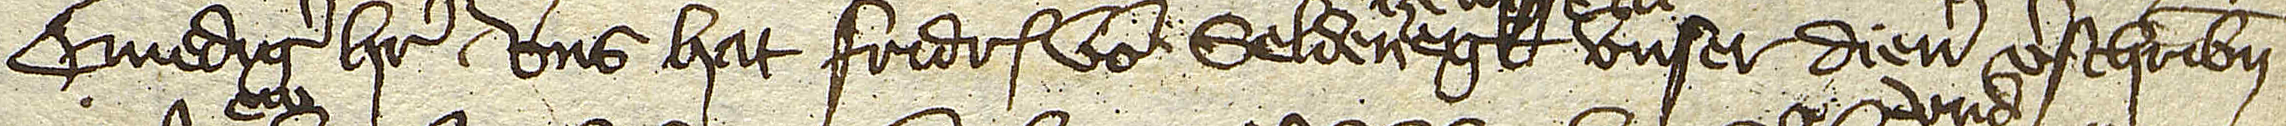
Gnedig* hr* / vns hat Fridr* vo* Seldenegk vnſer dien* v*ſchribn*
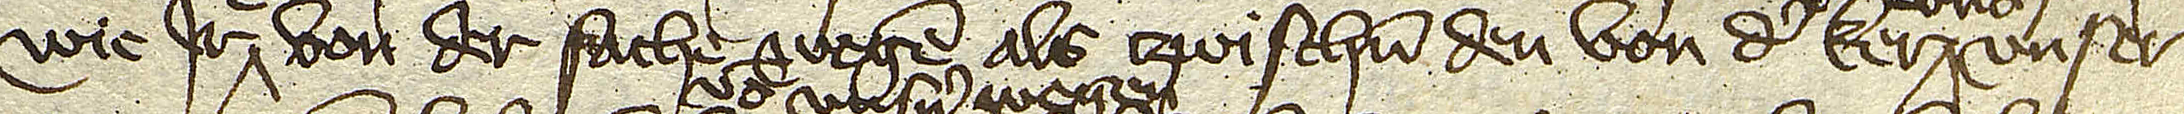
wie Ir von der ſache wege* als cʒwiſchn* den von d* ker vnſer
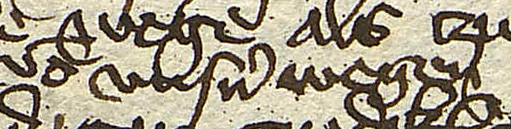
vo* vnſn* wegen
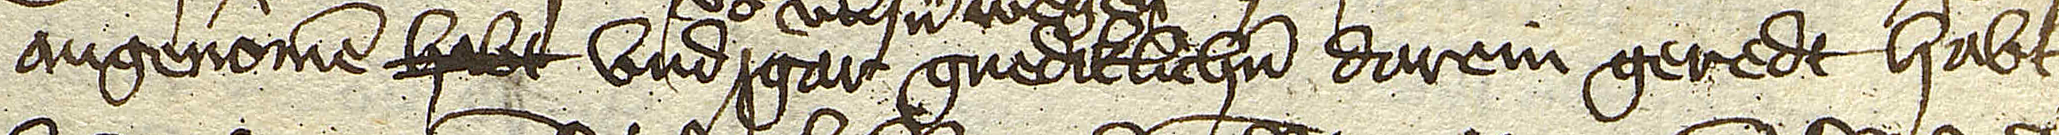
angenome* habt vnd gar gnediklichn* darein geredt habt
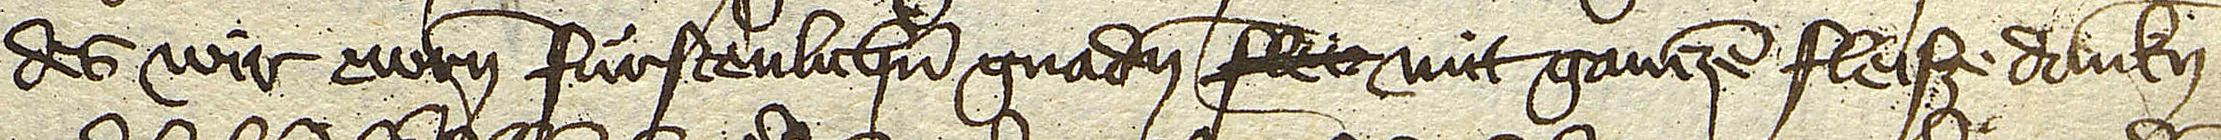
des wir ewrn* fürſtenlichn* gnadn* flei mit gancʒe* fleiſʒe dankn*
